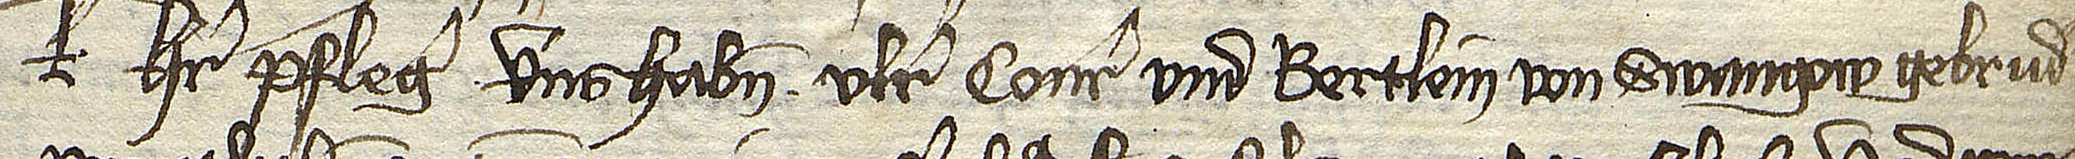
L* hr* pfleg* . Vns habn* vlr* Conr* vnd Bertlein von Swangow gebrud*
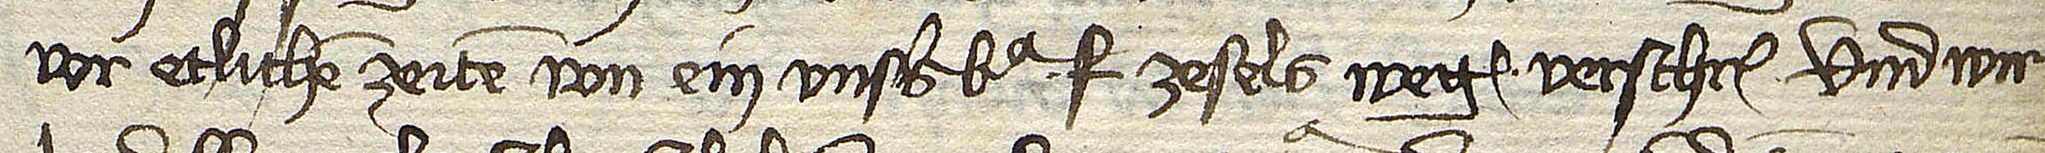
vor etliche* ʒeite* von ein vnſ*s b* . f . ʒeſels weg* . verſchr* Vnd wir
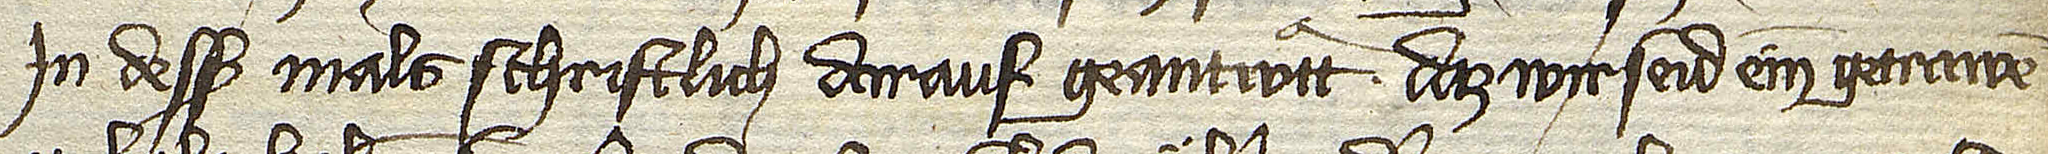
In deſſ* mals ſchriftlich darauf geantw*tt . daʒ wir ſeid ein* getrawe*
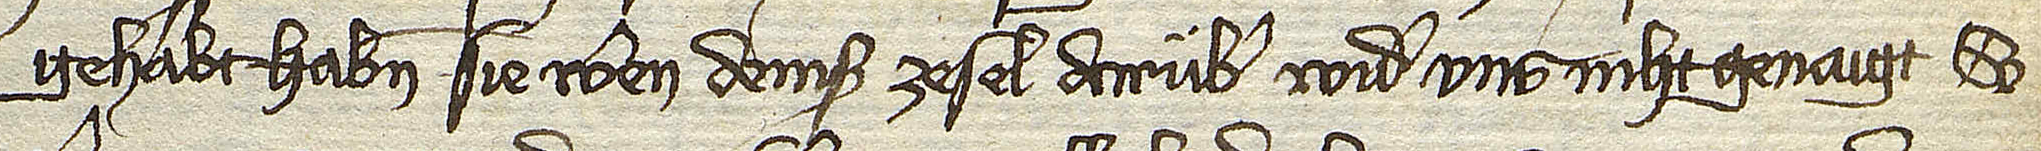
gehabt habn* . ſie w*en demſ* ʒeſel darüb* wid* vns niht genaigt So
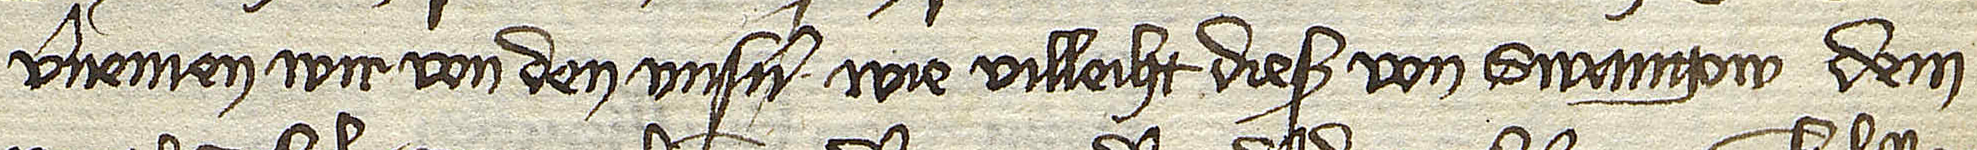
v*nemen wir von den vnſn* / wie villeiht dieſ* von Swangow Dem
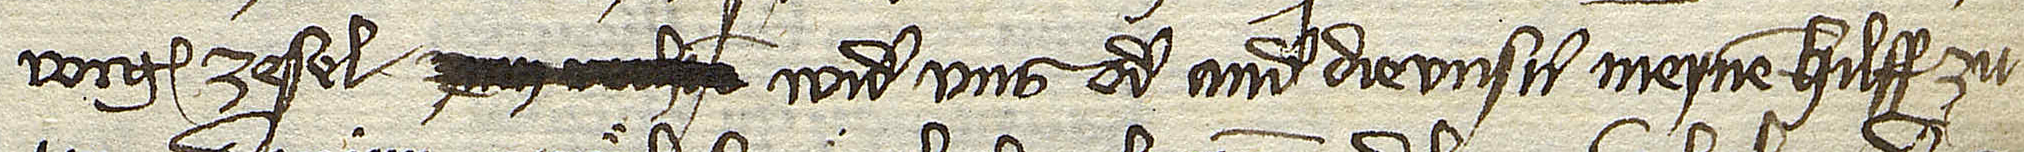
vorg* ʒeſel ʒum rechte* wid* vns od* and* die vnſn* meyne* hilff ʒu
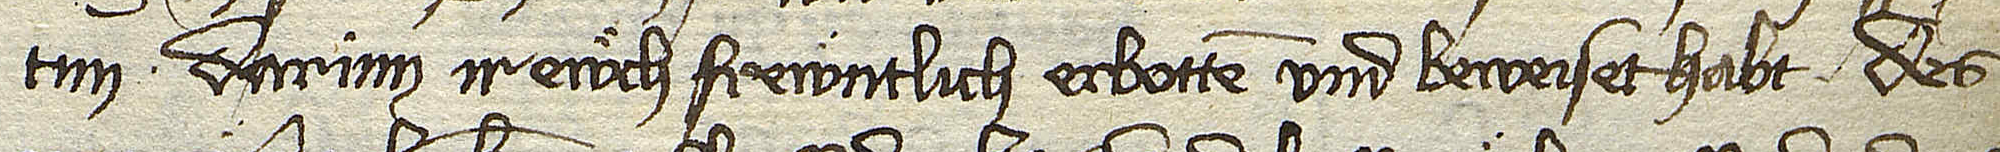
tun . Darinn ir eẅch freẅntlich erbotte* vnd beweiſet habt / Des
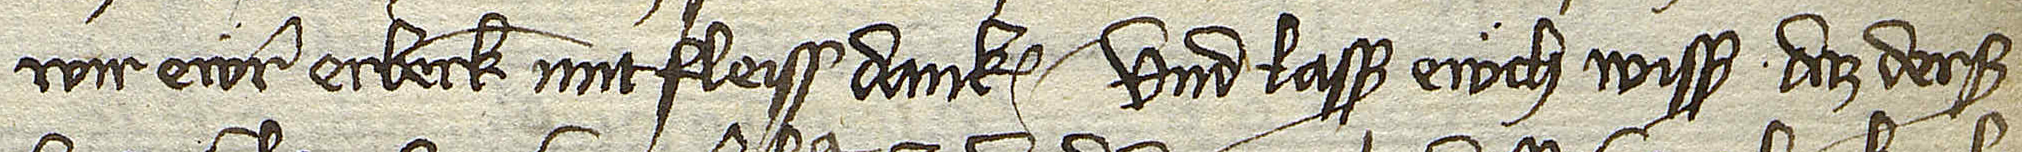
wir eẅr* erberk* mit fleiſſ dank* / Vnd laſſ* eẅch wiſſ* . daʒ derſ*
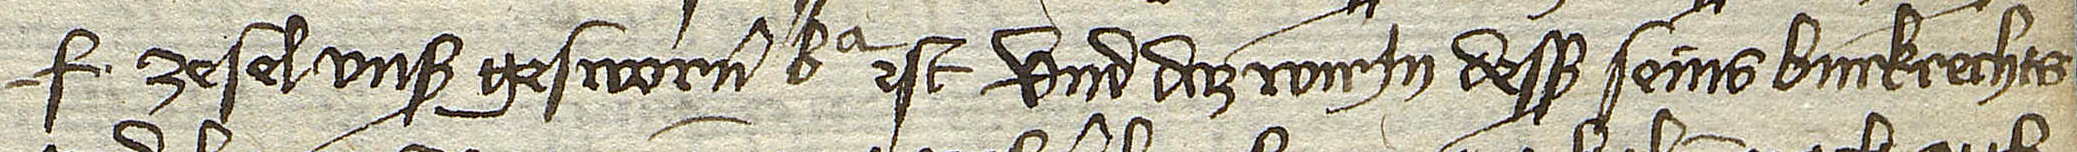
. f . ʒeſel vnſ* geſworn* b* iſt Vnd daʒ wir In deſſ* ſeins burkrechts
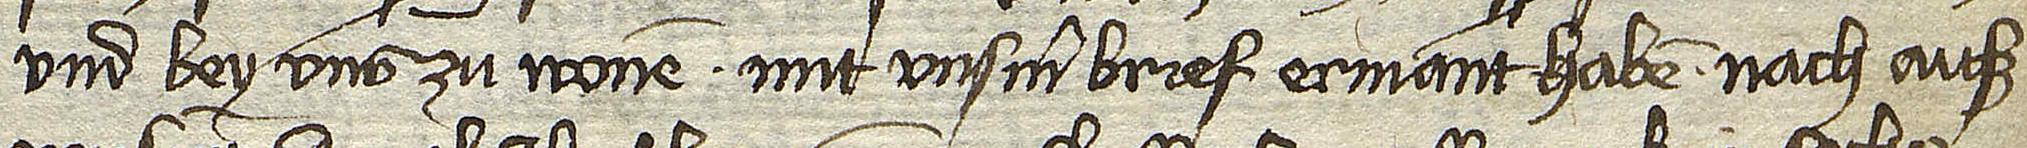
vnd bey vns ʒu wone* . mit vnſm* brief ermant habe* . nach auſʒ
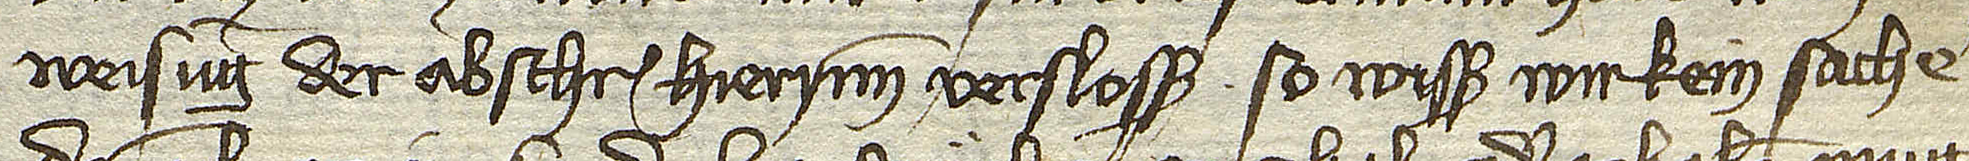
weiſu*g der abſchr* hierynn* verſloſſ* . ſo wiſſ* wir kein ſache
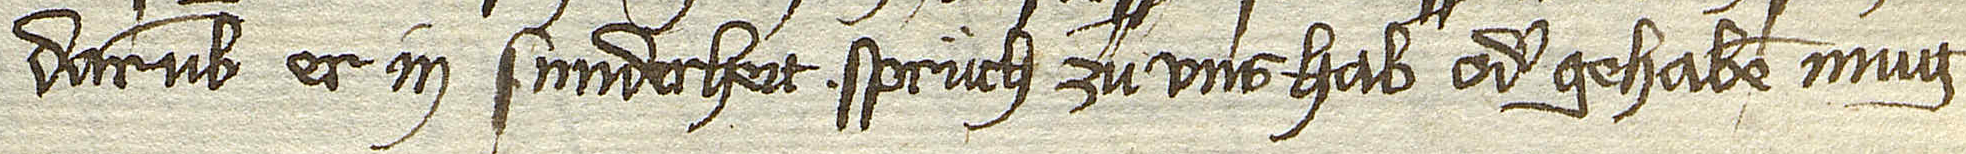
Darub* er in ſunderheit . ſprüch ʒu vns hab od* gehabe* mug
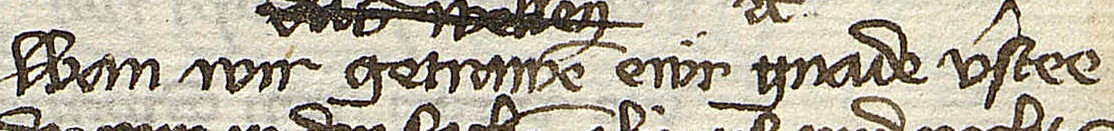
Wan wir getrawe* eẅr gnade v*ſtee
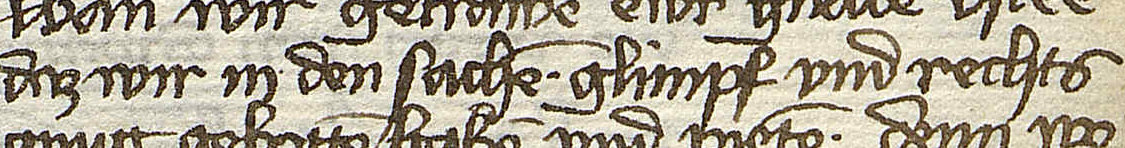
daʒ wir in den ſache* . glimpf vnd rechts
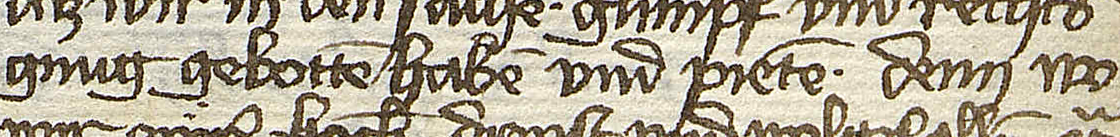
gnug gebotte* habe* vnd piete* . denn wo
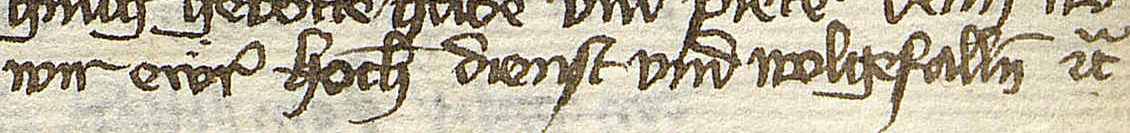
wir eẅr* hoch* dienſt vnd wolgefalln* ec*
